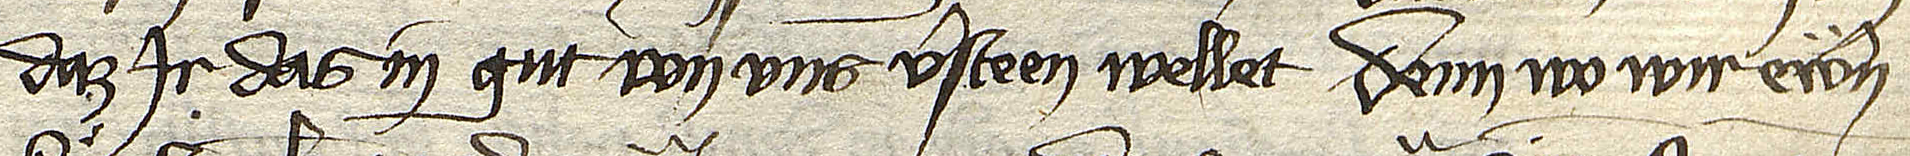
daʒ Ir das in gut von vns v*ſteen wellet / Denn wo wir ew*n
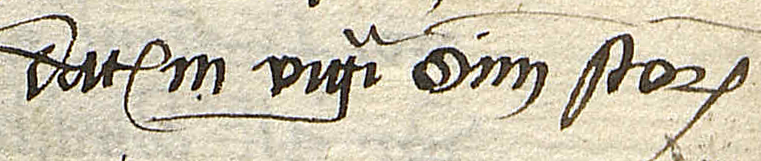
Dat* in vigi* Omi* ſco*
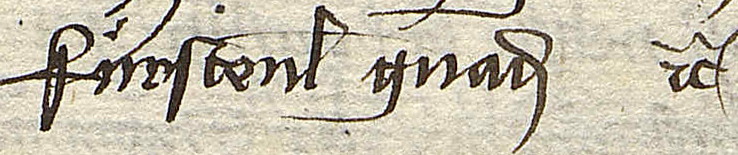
fürſtenl* gnad* ec*
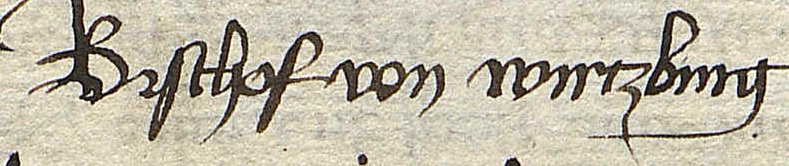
Biſchof von wircʒburg
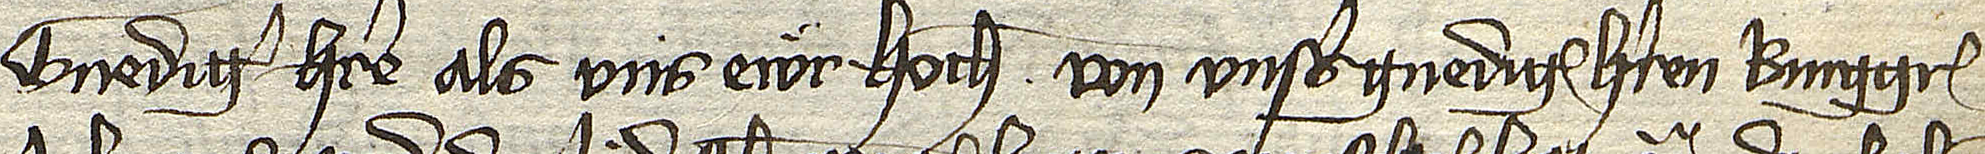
Gnedig* hr*e als vns ewr Hoch* von vnſ*s gnedig* h*ren Burggr*
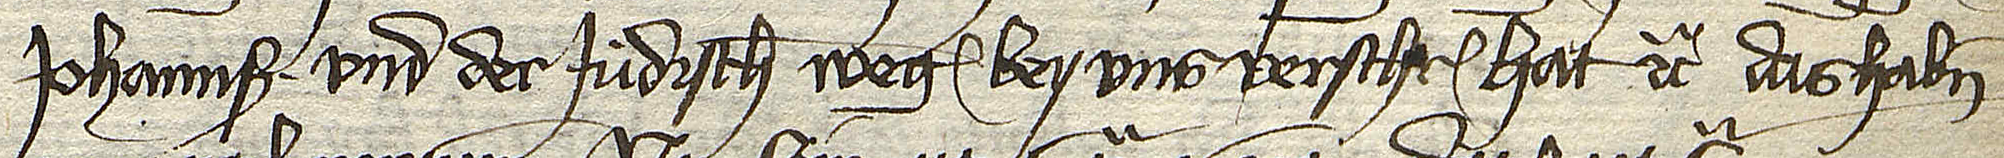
Iohannſ* vnd der Iüdiſch* weg* bey vns verſchr* hat ec* das habn*
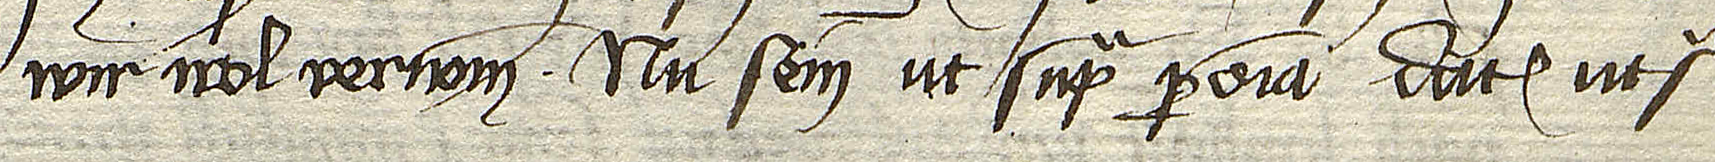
wir wol vernom* . Nu ſein ut ſup* p*oia* Dat* ut ſ*
